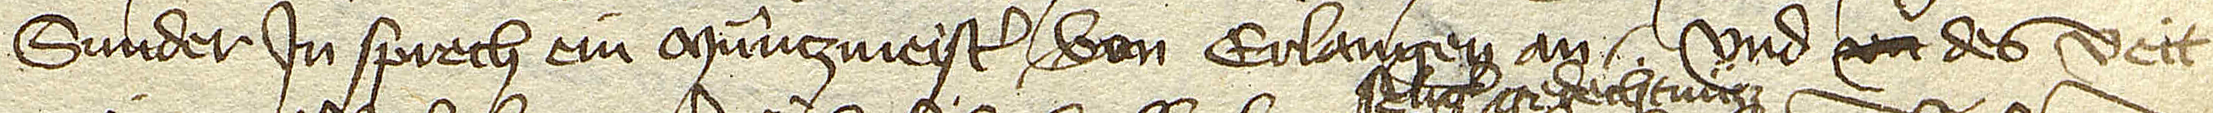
Sunder In ſprech ein Müncʒmeiſt* / von Erlangen an / . vnd vn des Veit
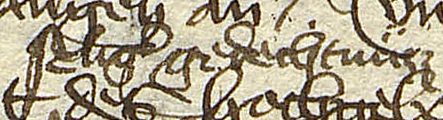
ſelig* gedechtnüʒʒ
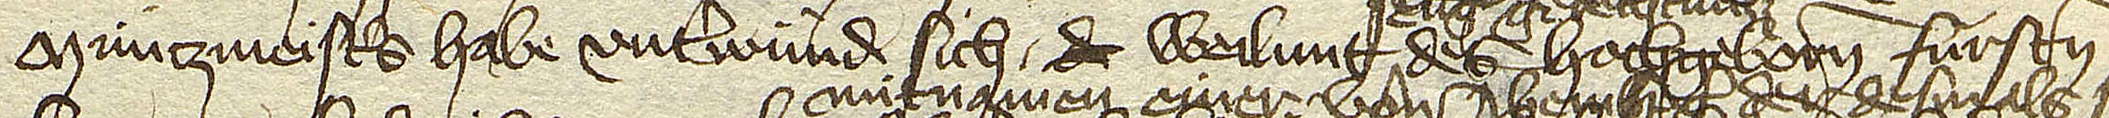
Müncʒmeiſt*s habe vnt*wünd ſich / d weilunt des hochgeborn* fürſtn*
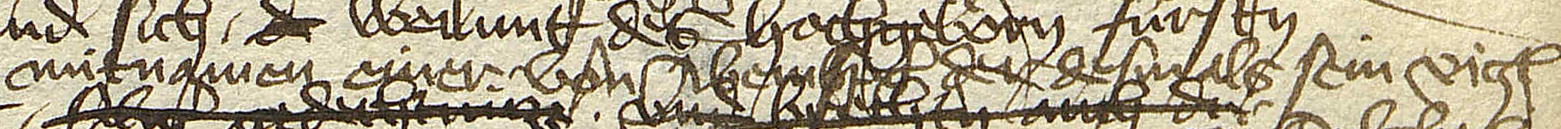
mitnamen einer von Abemſpg* der deſmals ſein vicʒt*
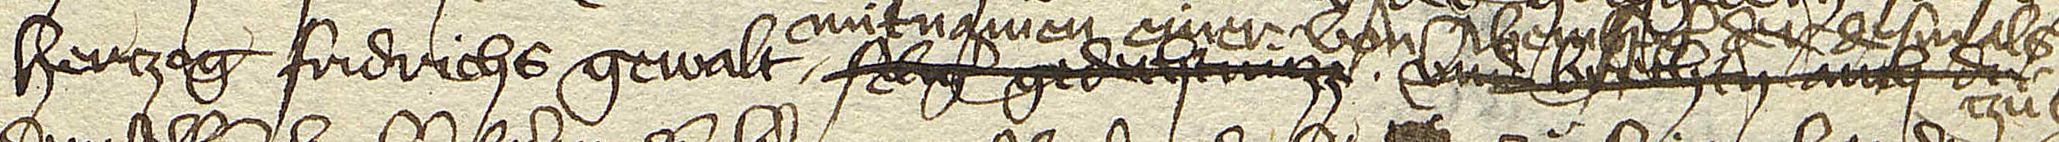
hercʒog fridrichs gewalt / ſelig* gedechtnüʒʒ . vnd brechtn* auch d%
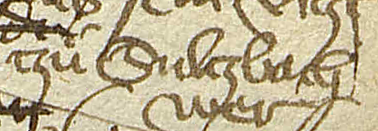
cʒü Sulcʒbach
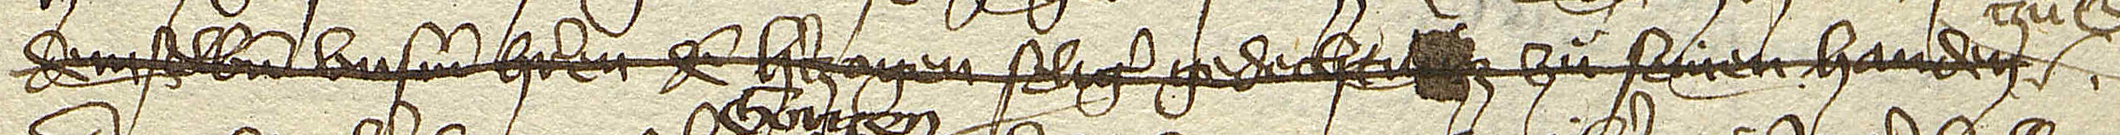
demſelbn* vnſm* hr*en d* h*cʒogen ſelig* gedechtnüʒʒ cʒü ſeinen handen /.
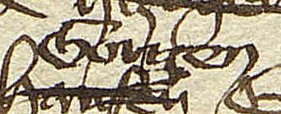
Görgen
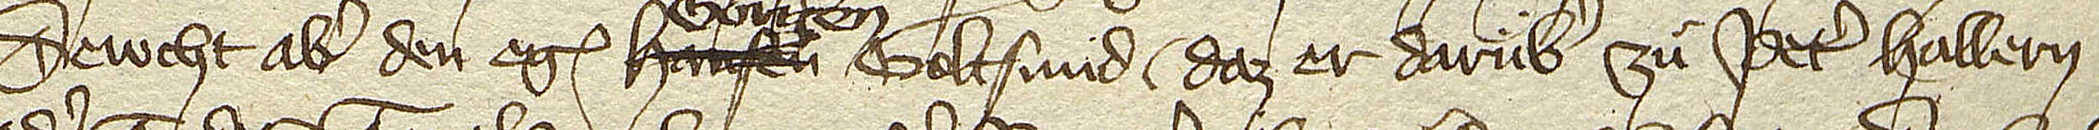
Dewcht ab* den eg* hanſen Goltſmid / daʒ er darüb* cʒu Pet* hallern
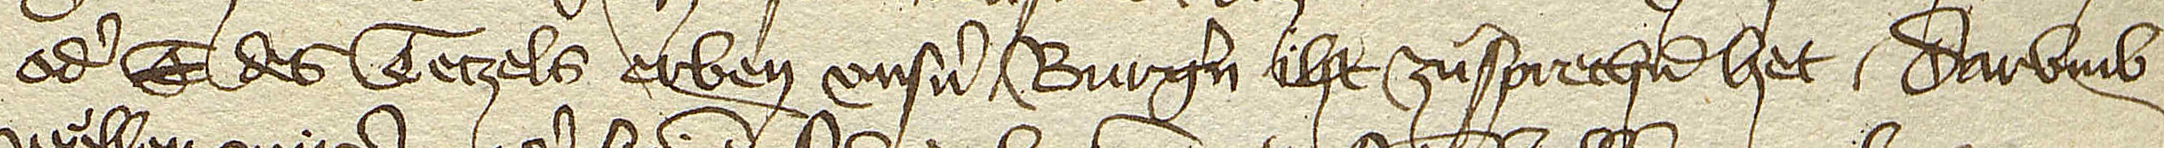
od* T des Tecʒels erben vnſn* Burg*n iht cʒüſprechn* het / Darvmb
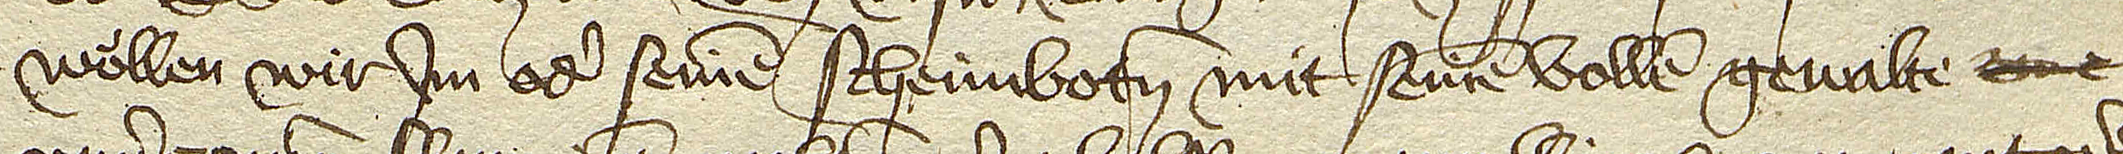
wöllen wir Im od* ſeine* ſcheinbotn* mit ſeine* volle* gewalte e% %
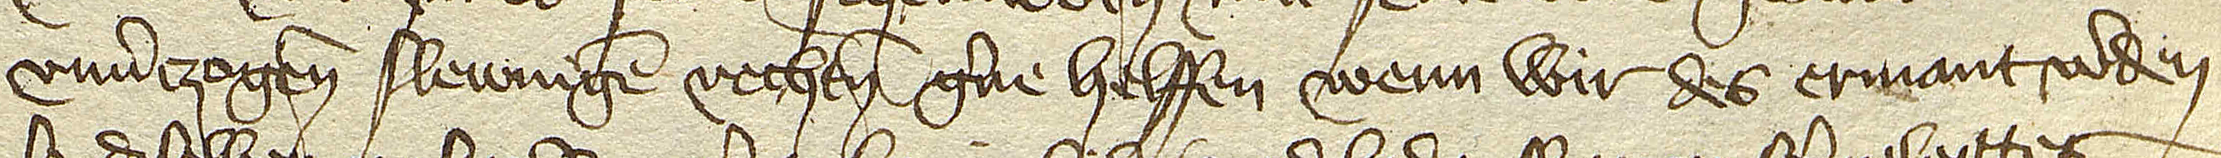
vnu*cʒogen* ſlewnige* rechtn* g*ne helffen wenn wir des ermant w*den
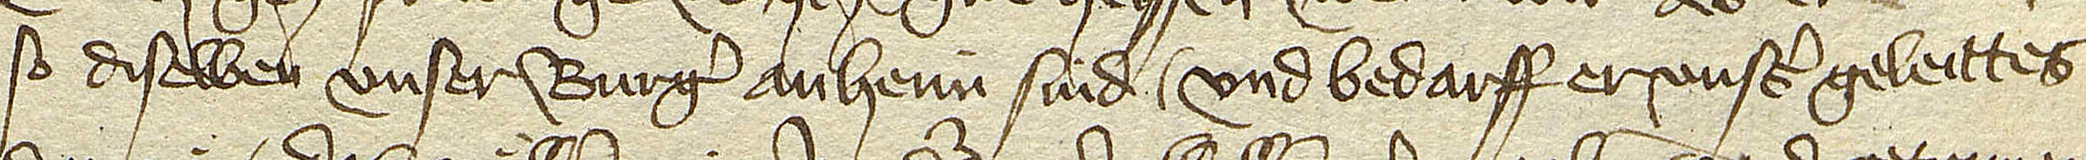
ſo diſelben vnſer Burg* anheim ſind / vnd bedarff er vnſs* geleittes
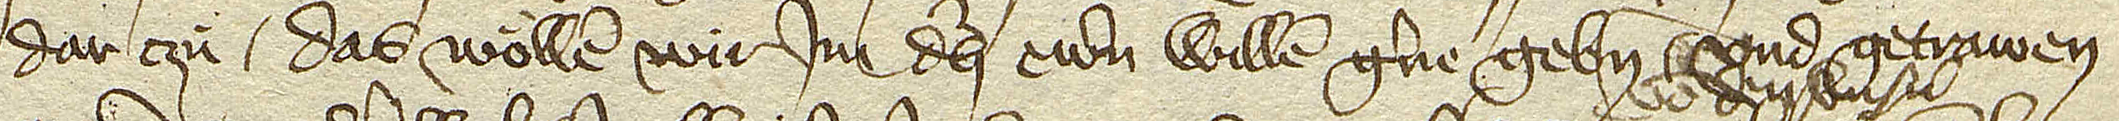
dar cʒü / das wölle* wir Im d*h ew*n wille* g*ne gebn* / vnd getrawen
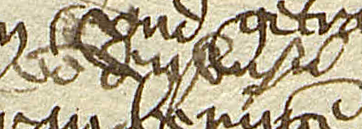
vo* den vnſn*
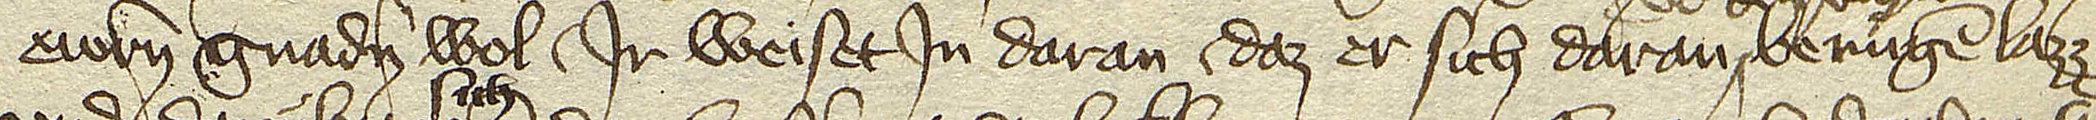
ew*rn gnadn* wol / Ir weiſet In daran / daʒ er ſich daran benüge* laʒʒ
